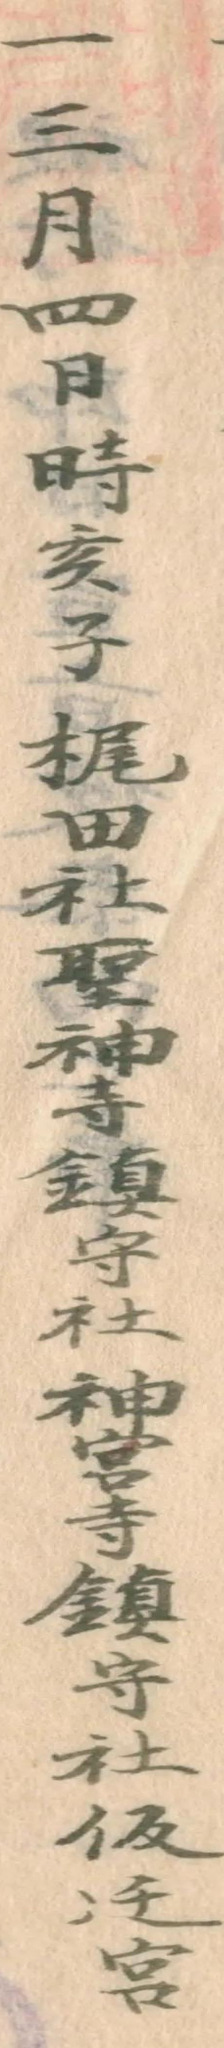一三月四日時亥子梶田社聖神寺鎮守社神宮寺鎮守社仮迁宮
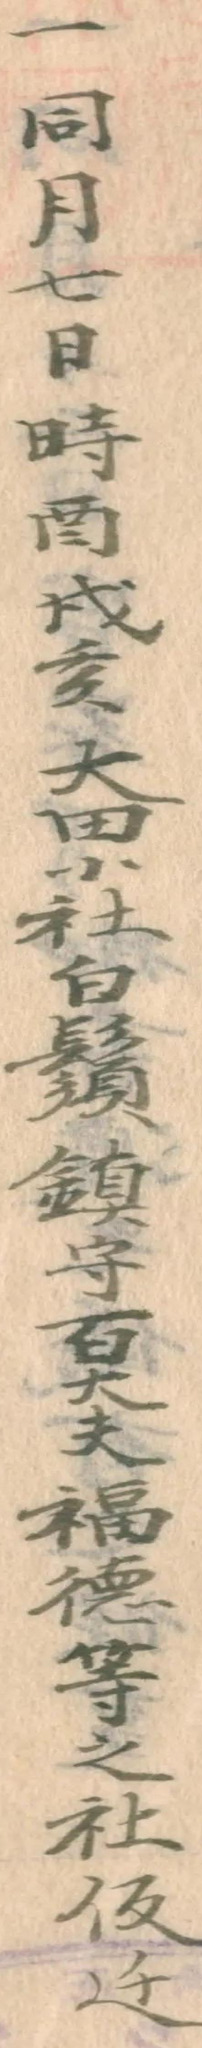一同月七日時酉戌亥大田小社白鬚鎮守百大夫福徳等之社仮迁
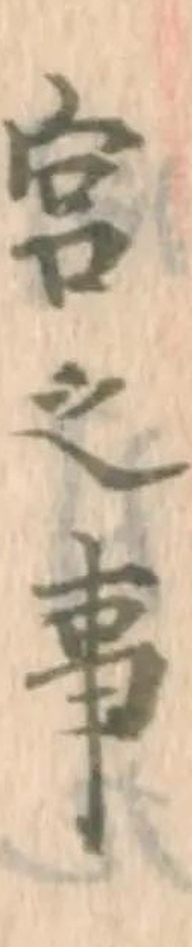宮之事
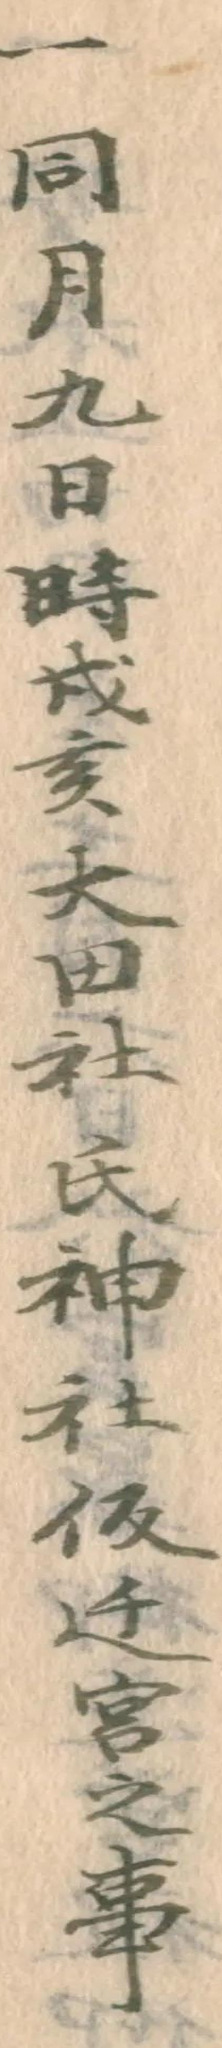一同月九日時戌亥大田社氏神社仮迁宮之事
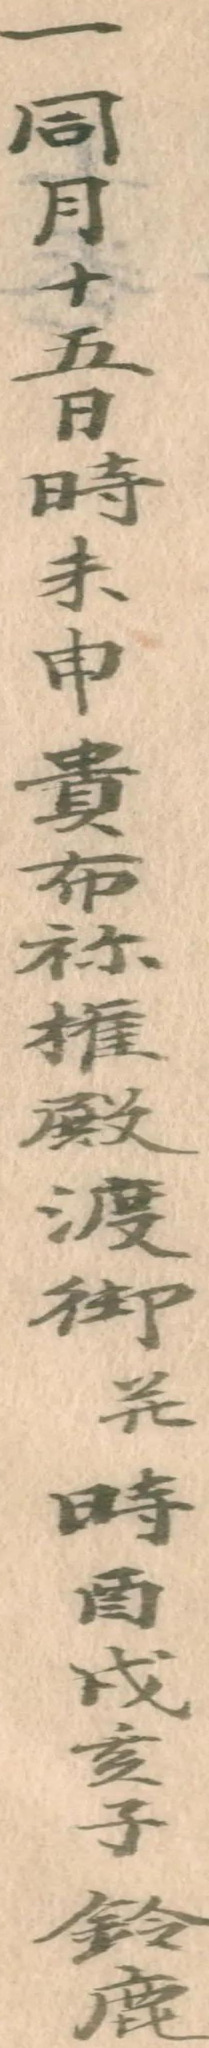一同月十五日時未申貴布祢権殿渡御并時酉戌亥子鈴鹿
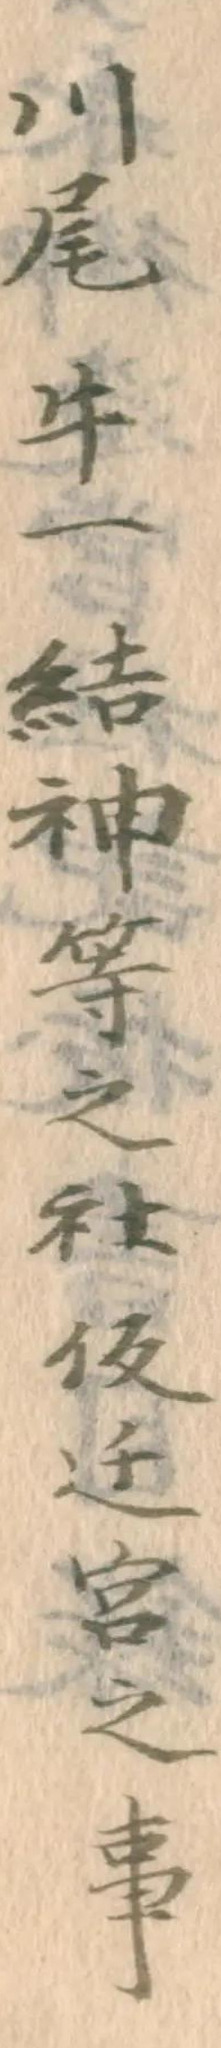川尾牛一結神等之社仮迁宮之事
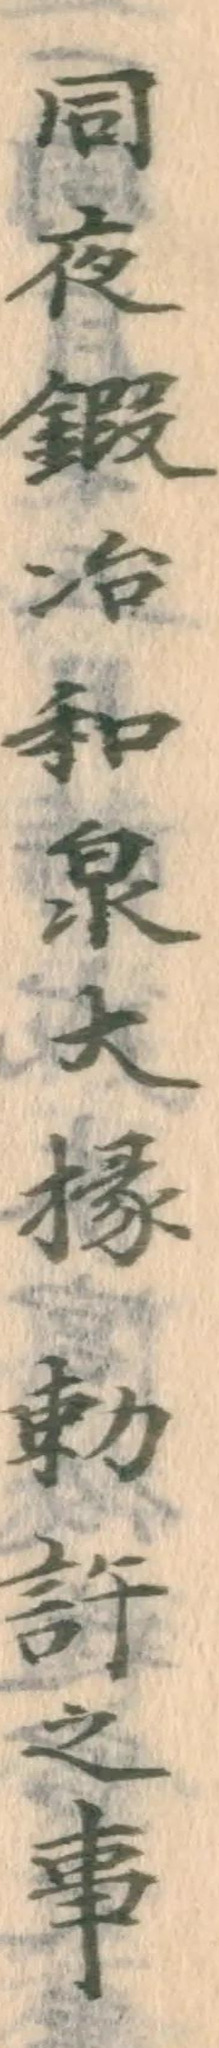同夜鍛冶和泉大椽勅許之事
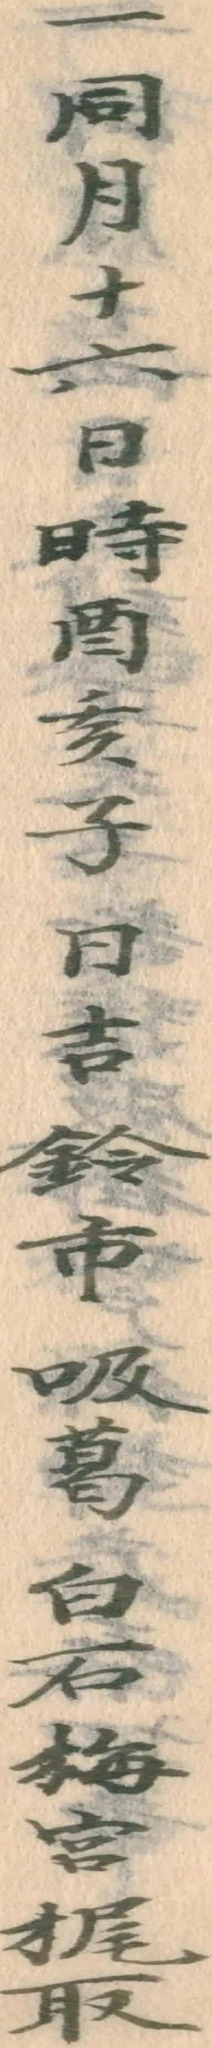一同月十六日時酉亥子日吉鈴市吸葛白石梅宮梶取
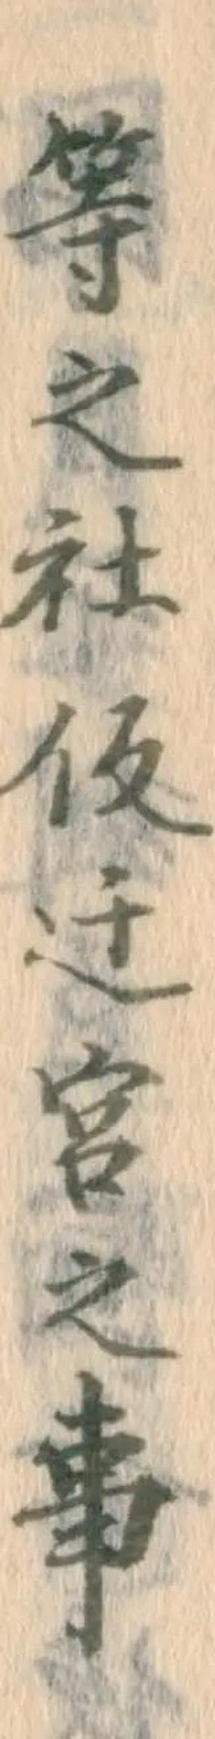等之社仮迁宮之事
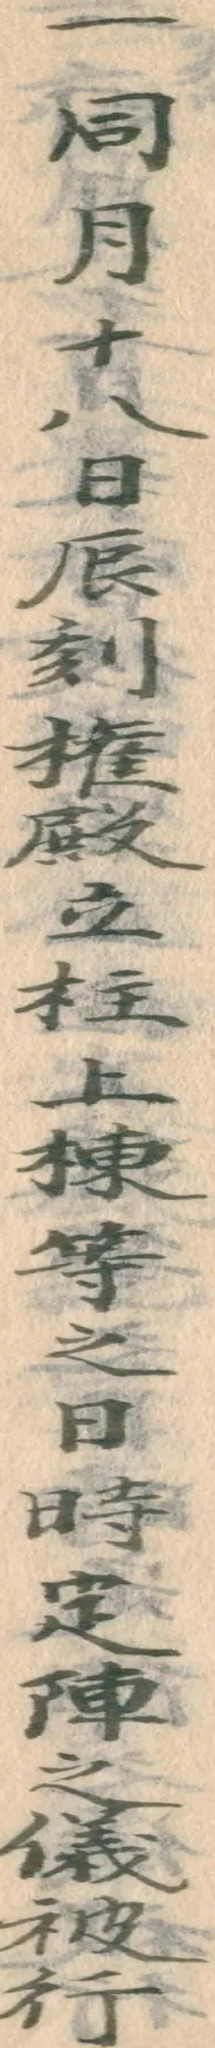一同月十八日辰刻権殿立柱上棟等之日時定陣之儀被行
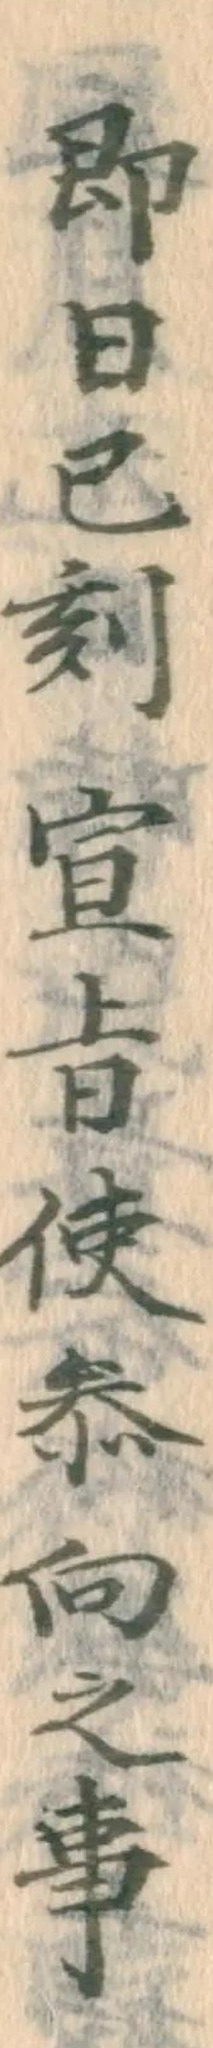即日巳刻宜旨使参向之事
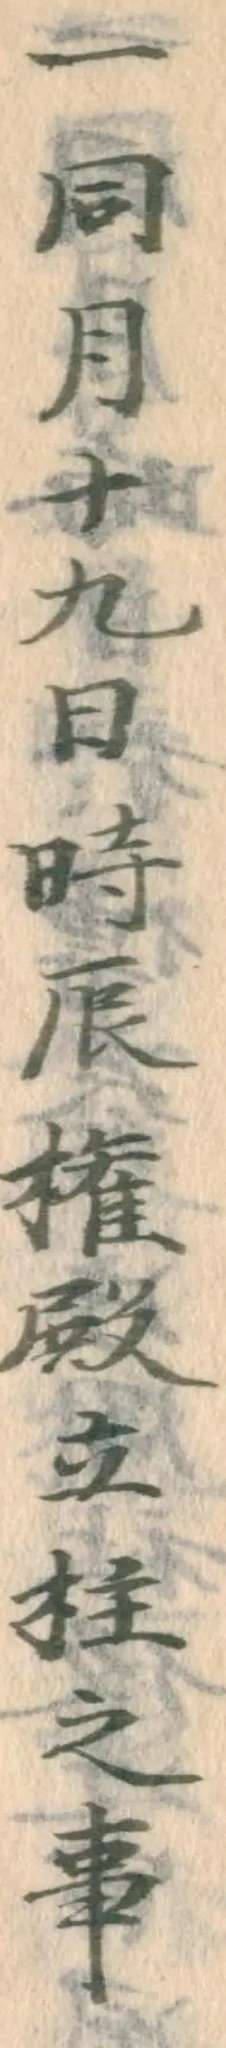一同月十九日時辰権殿立柱之事
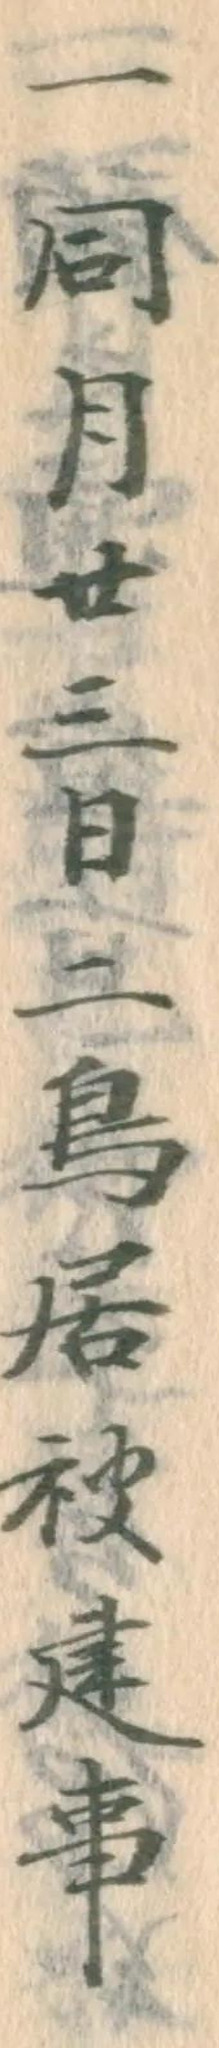一同月廿三日二鳥居被建事
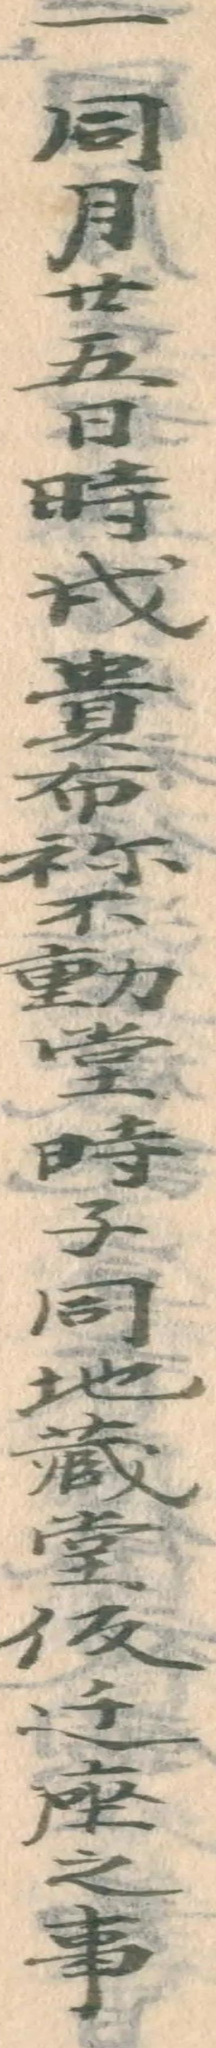一同月廿五日時戒戌貴布祢不動堂時子同地蔵堂仮迁座之事
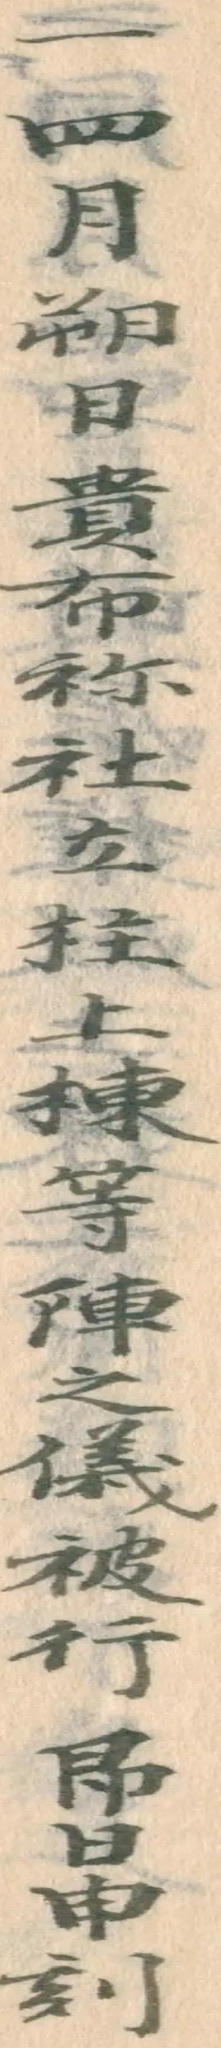一四月朔日貴布祢社立柱上棟等陣之儀被行即日申刻
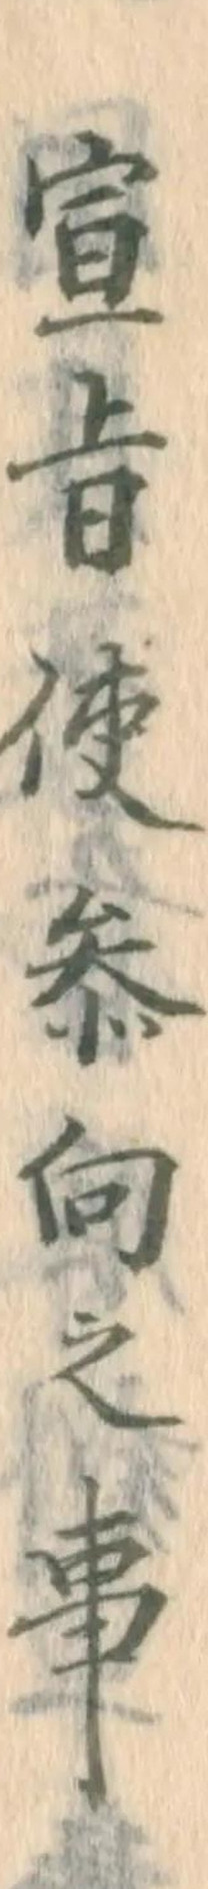宣旨使参向之事
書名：賀茂社記録. 第17冊
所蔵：国立国会図書館 National Diet Library, JAPAN
